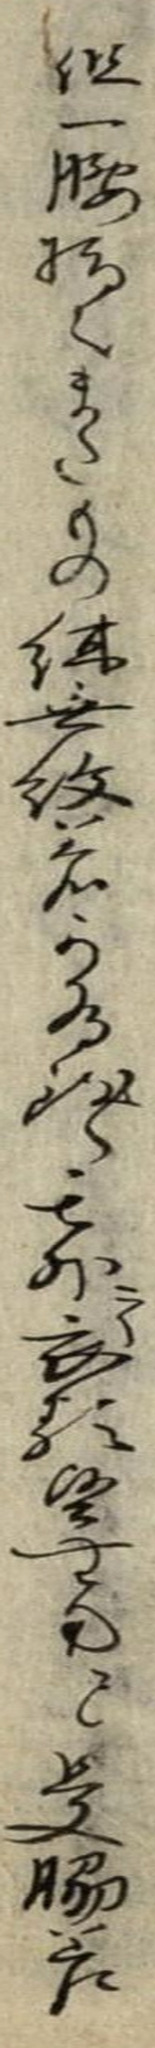但一腰指之またもの紺無紋着可為致候其外之衣類堅無用に候且又脇差
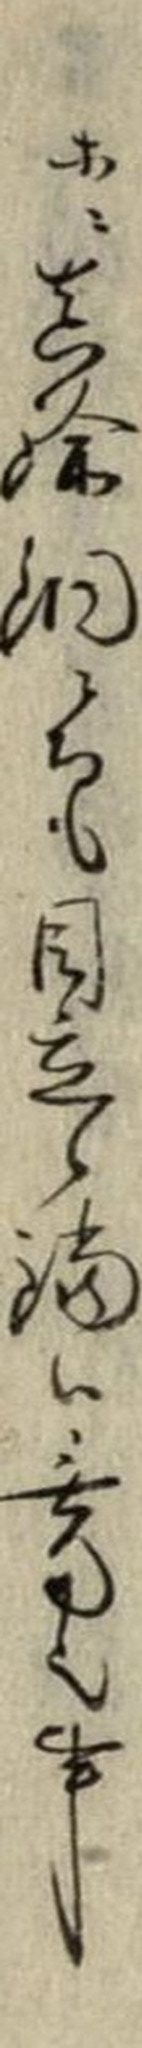等に真鍮銅にても目立候鐺は無用之事
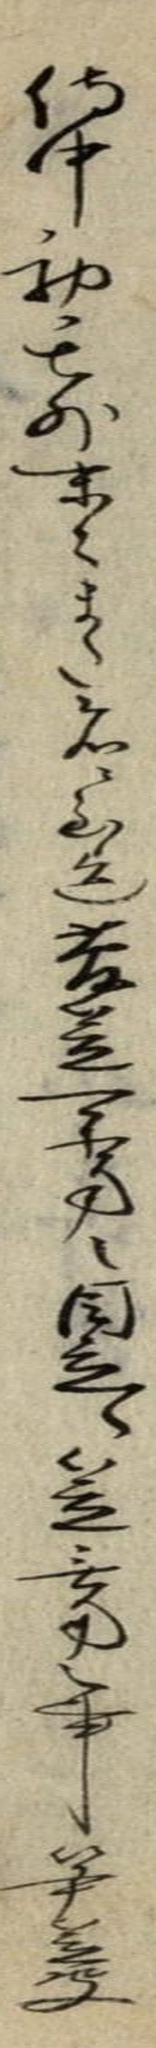一侍中初其外末々また者に至迄菅笠可相用候目立候笠無用之事笋笠決
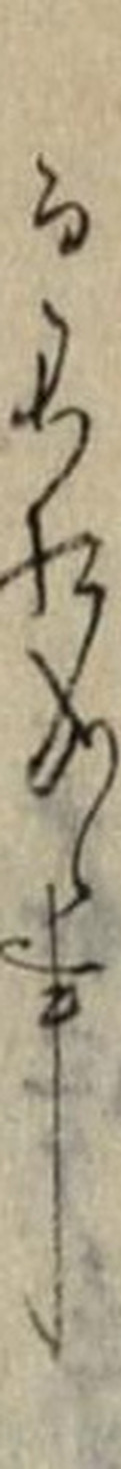て不相成候事
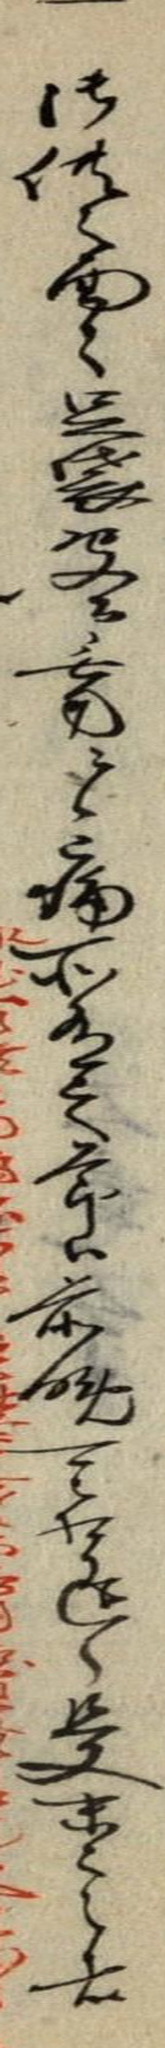一御供之面々足袋決て無用に候痛所有之節は前晩可相達候且又末々之者
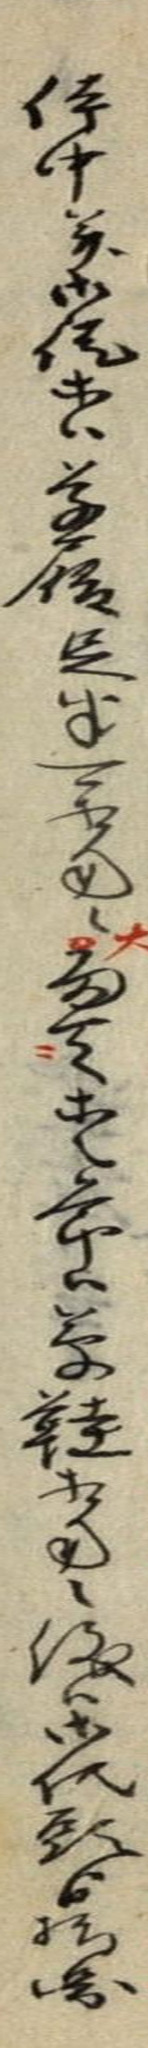一侍中并御徒等は草履足半可相用候「大」雨「天」等之節は草鞋相用之儀は御供頭ゟ指図
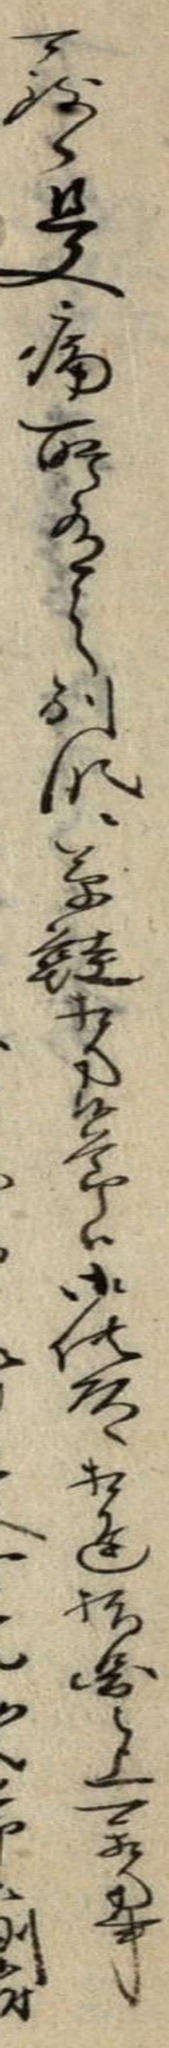可致候且又痛所有之別段に草鞋相用候節は御供頭へ相達指図之上可相用事
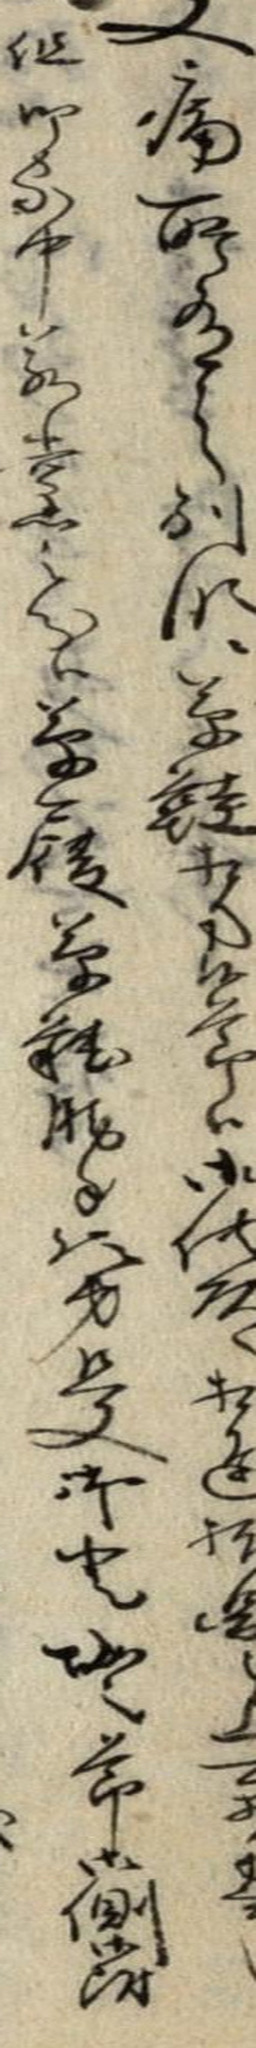但御家中若党之分は草履草鞋勝手次第且又御登城之節御側御附
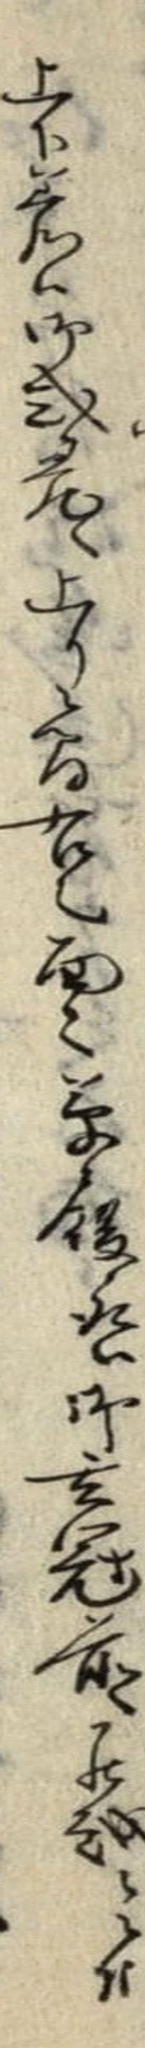上下着は御式台へ上り候間右之面々草履取は御玄冠前へ罷越候に付
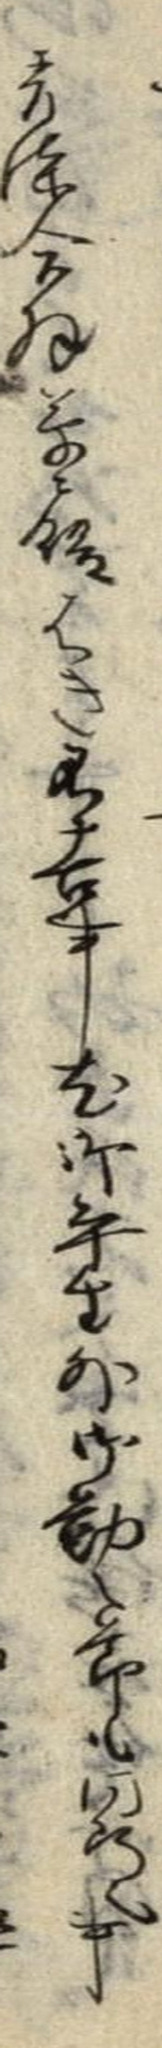青漆合羽草履はき不苦事尤御平生外御勤之節も同断之事
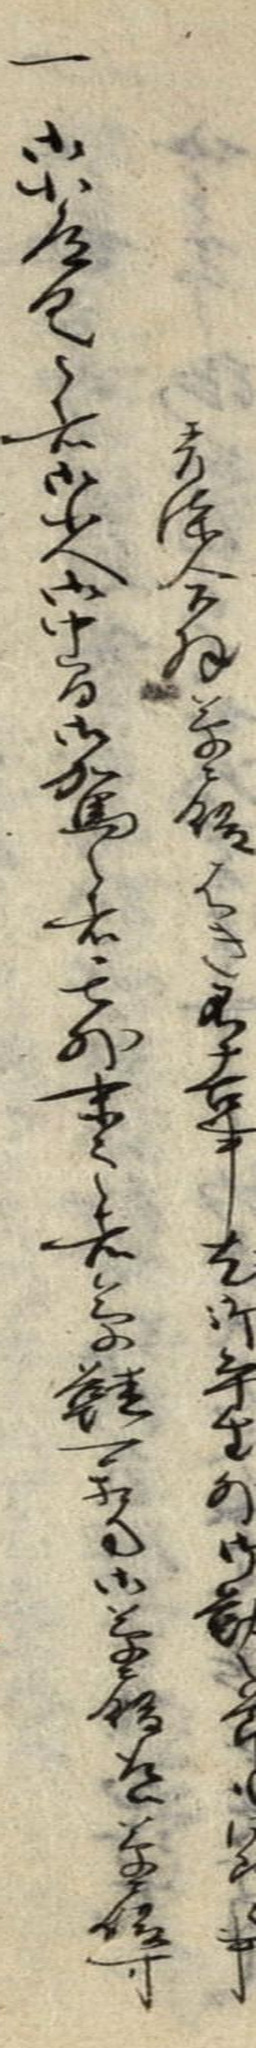一御小道具之者御小人御中間御駕之者其外末々之者草鞋可相用御草履取は草履可
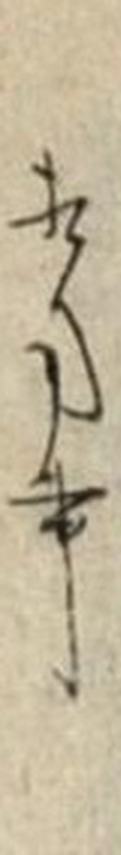相用事
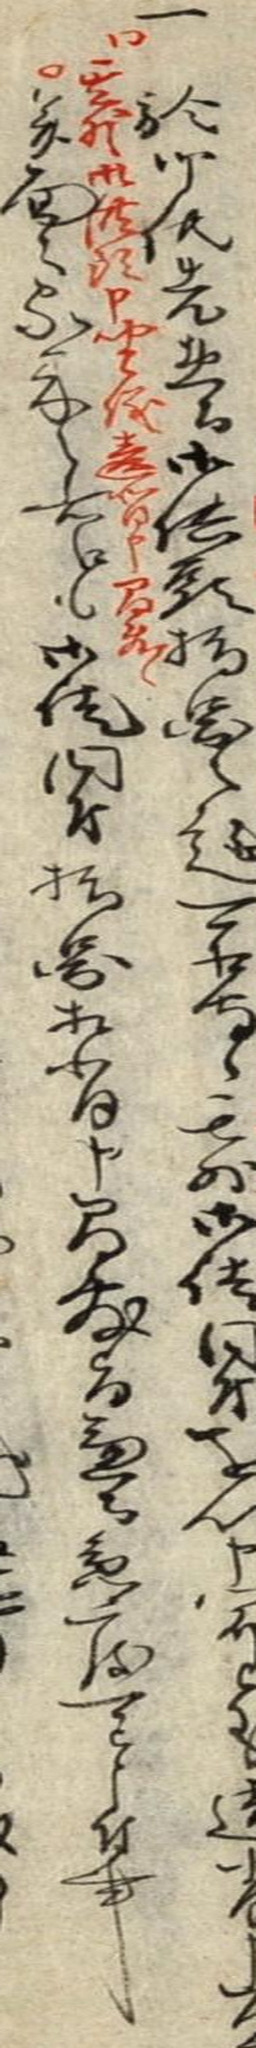并面々家来之者江も御徒目付指図相背申間敷旨兼て急度可被申付事
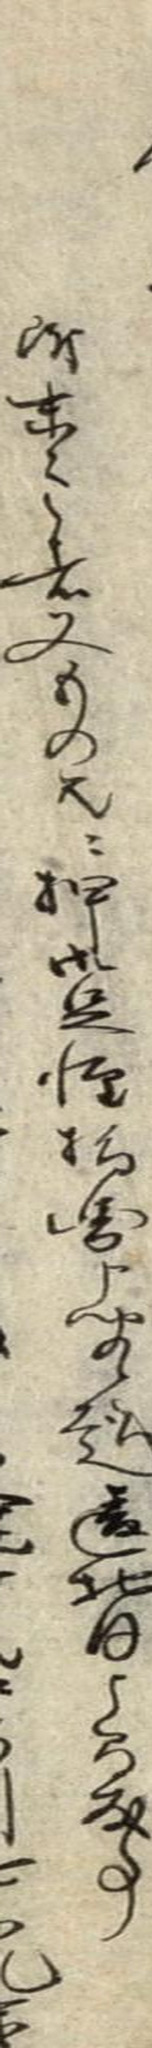附末々之者又もの共に押御足軽指図申聞候趣違背申間敷事
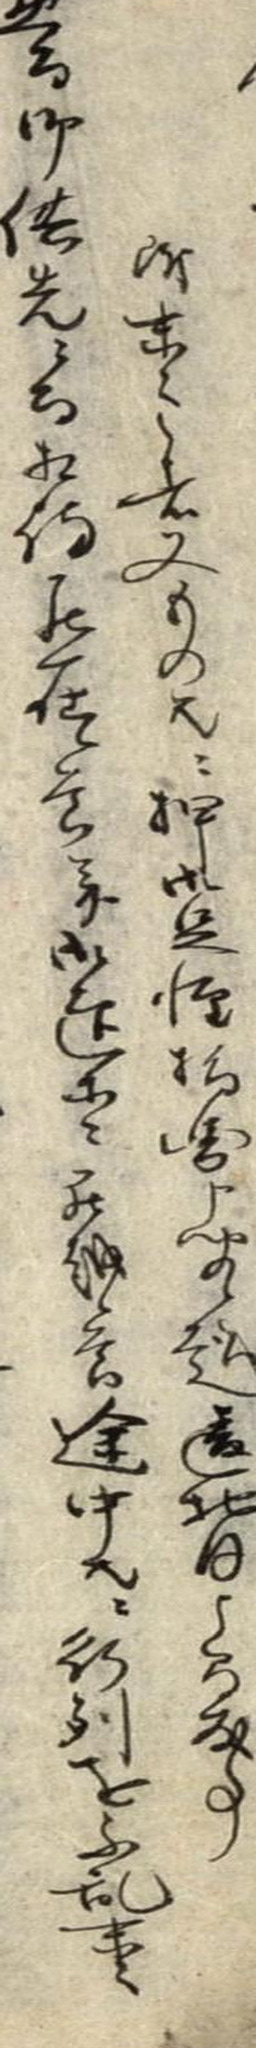一惣て御供先にて相待罷在候節并御迎等に罷越候節途中共に行列を不乱末々
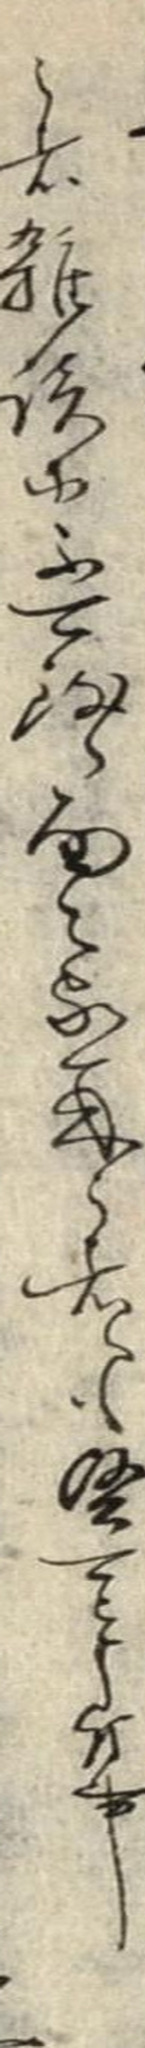之者雑談等不致候面々家来之者へも堅可申付事
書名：三都并道中之部
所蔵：福井県文書館 Fukui Prefectural Archives
